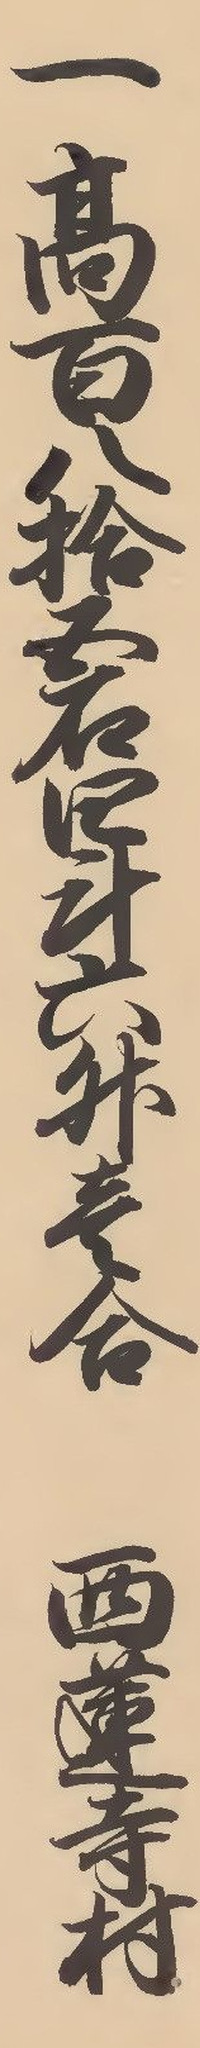一高百八拾五名四斗六升壱合西蓮寺村
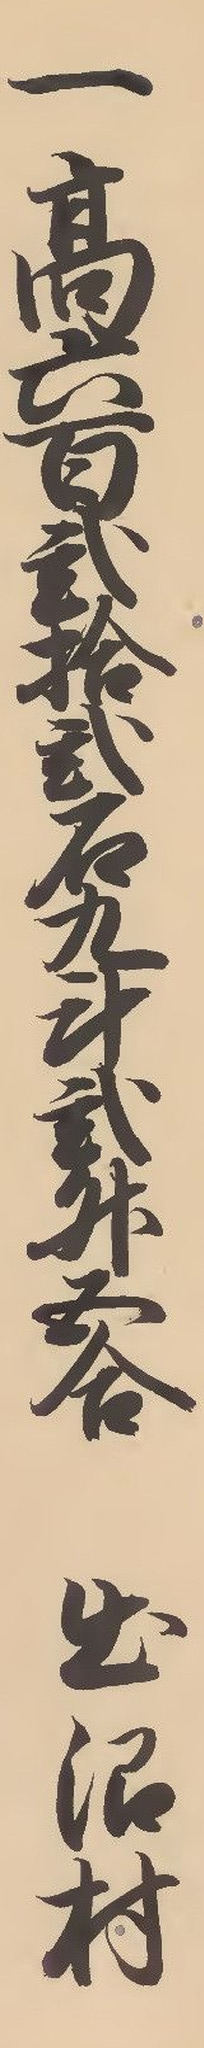一高六百弐拾弐石九斗弐升五合出沼村
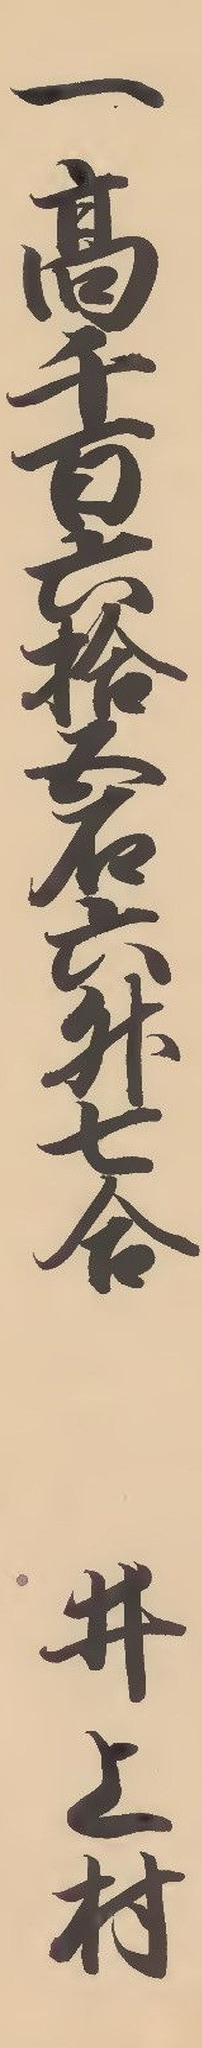一高千百六拾五石六升七合井上村

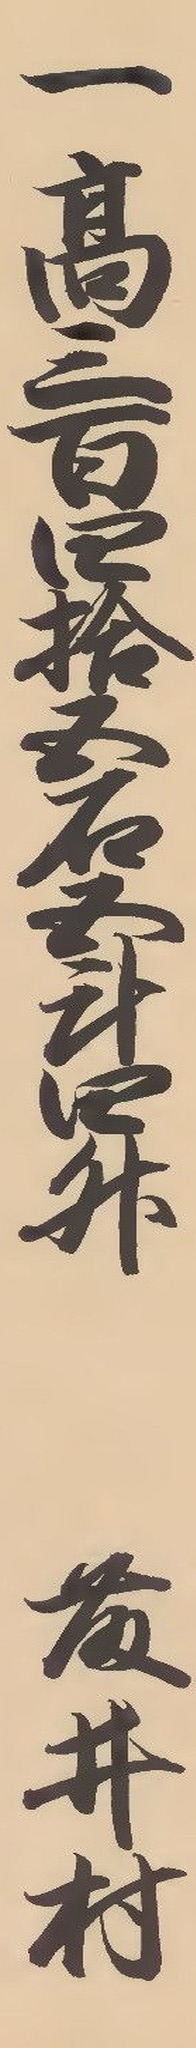一高三百四拾五石五斗四升藤井村
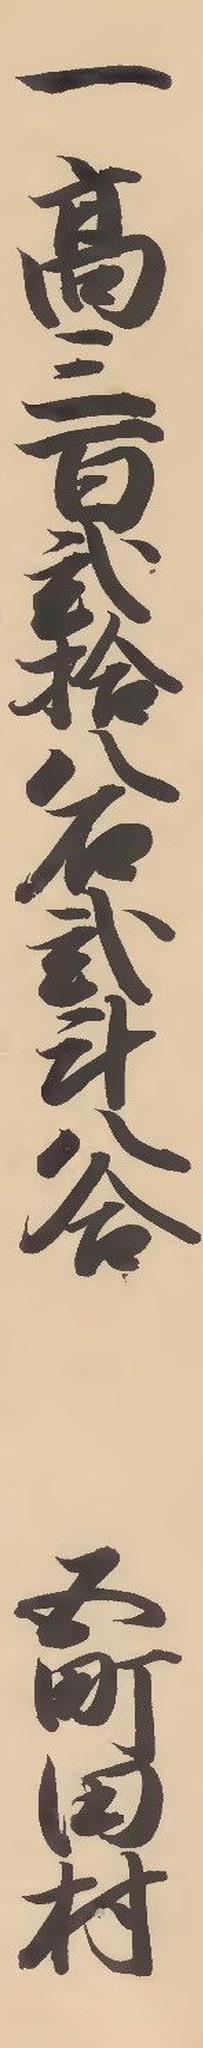一高三百弐拾八石弐斗八合五町田村
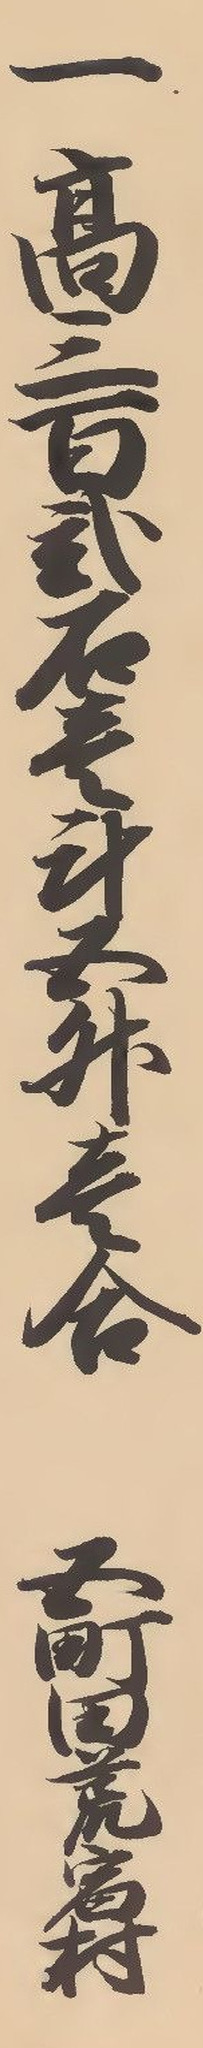一高三百弐石壱斗五升壱合五町田荒宿村
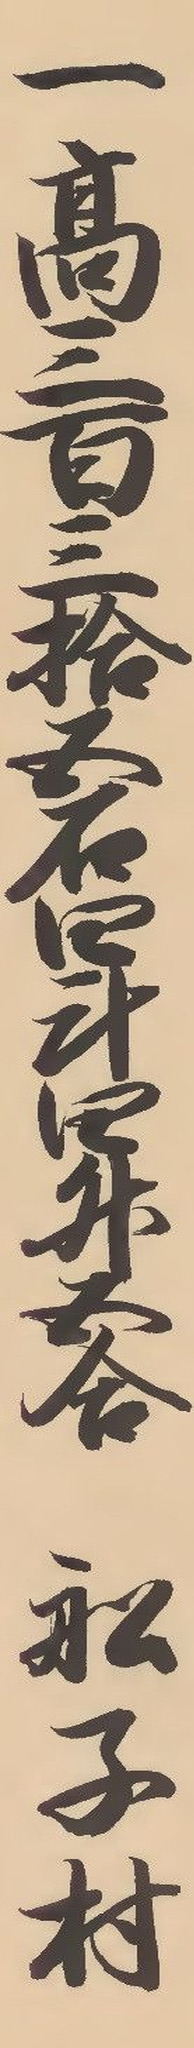一高三百三拾五石四斗四升五合船子村
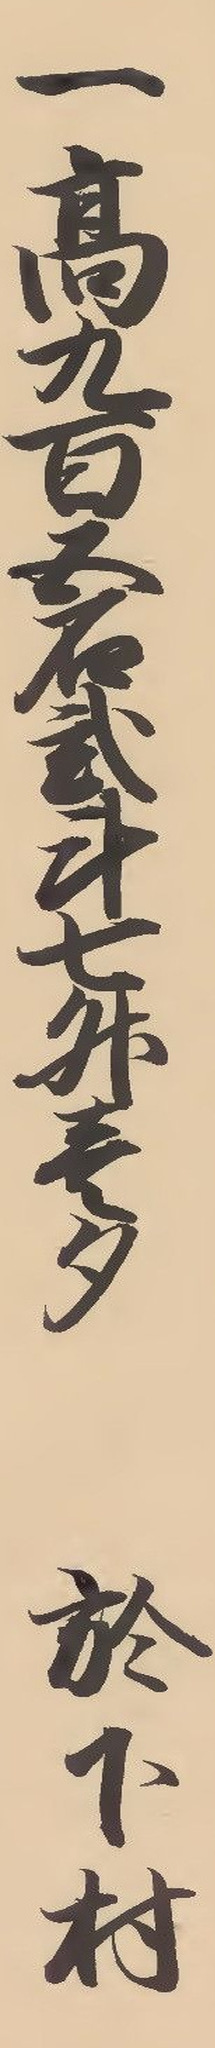一高九百五石弐斗七升壱勺於下村
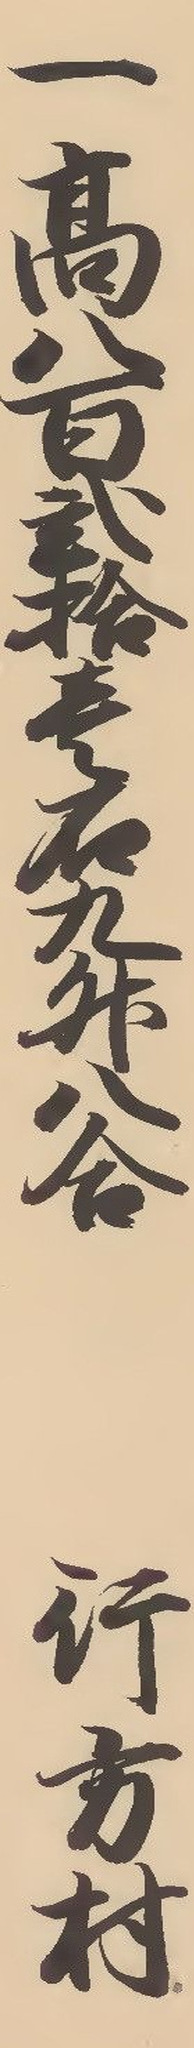一高八百弐拾壱石九升八合行方村
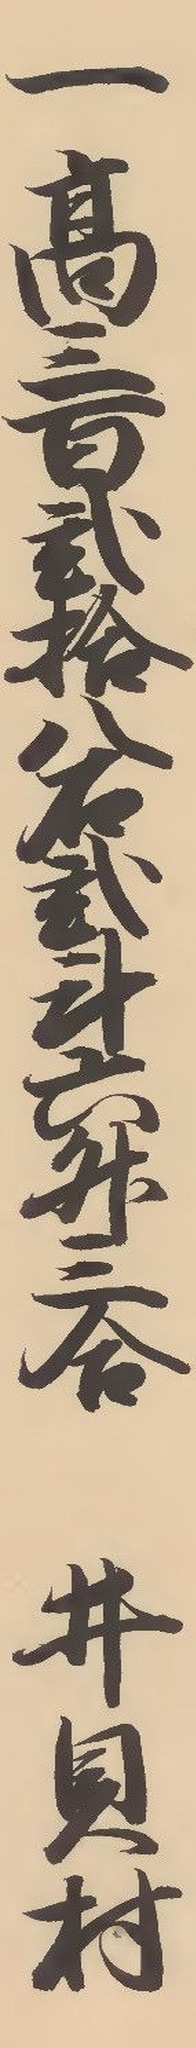一高三百弐拾八石弐斗六升三合井貝村
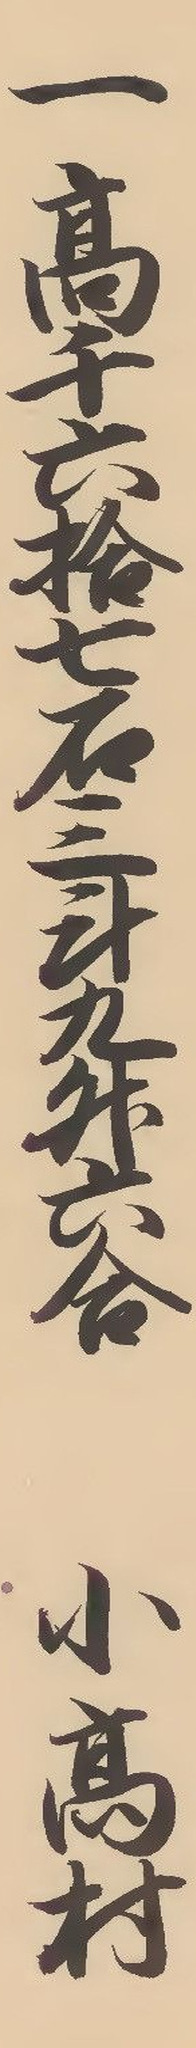一高千六拾七石三斗九升六合小高村

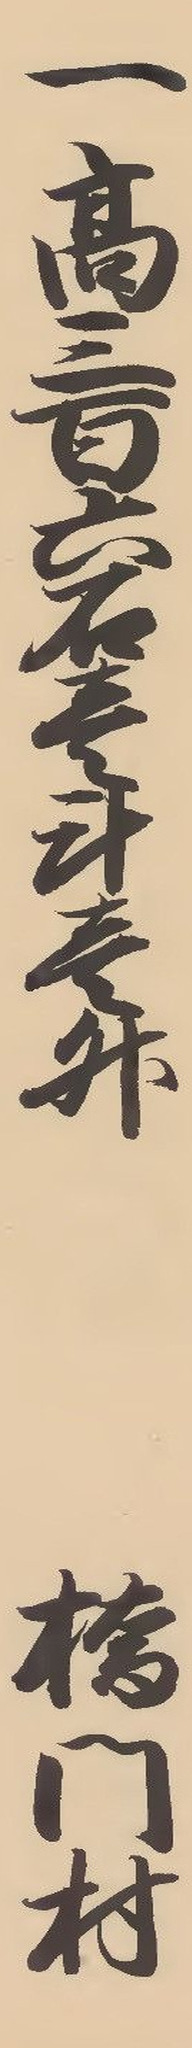一高三百六石壱斗壱升橋門村
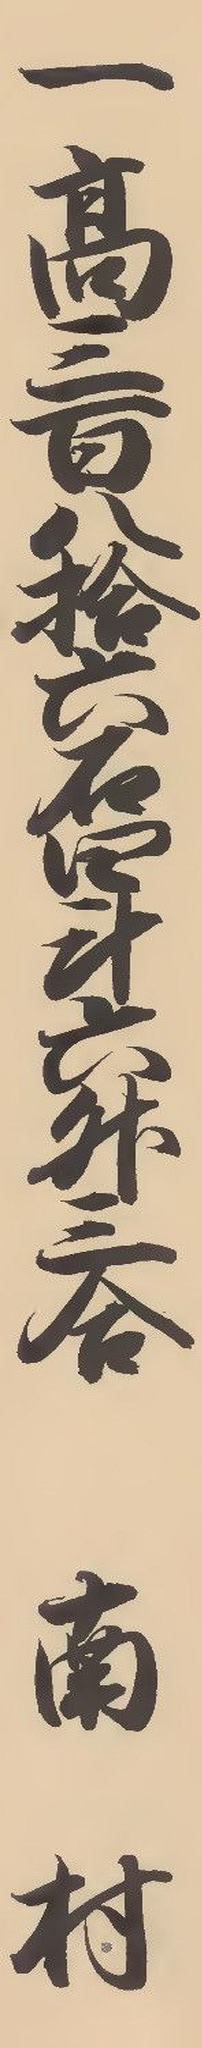一高三百八拾六石四斗六升三合南村
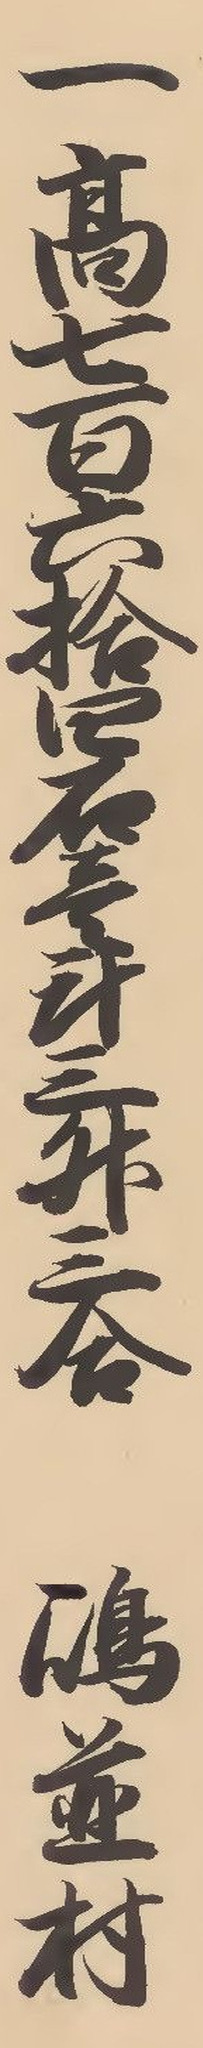一高七百六拾四石壱斗三升三合島並村
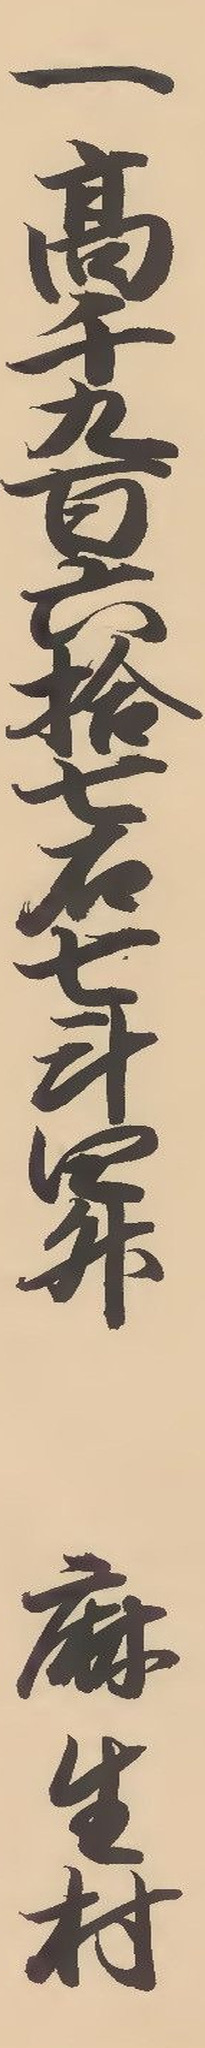一高千九百六拾七石七斗四升麻生村
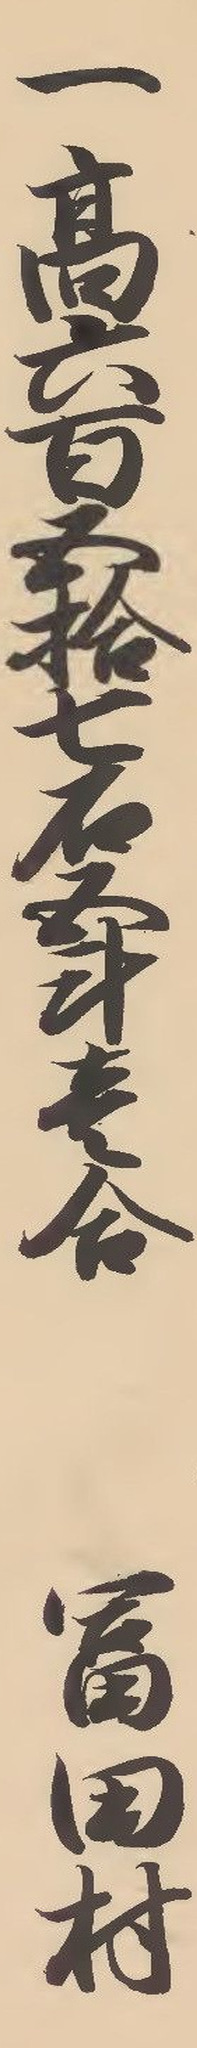一高六百五拾七石五斗壱合富田村
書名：常陸国郷帳
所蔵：国立公文書館 National Archives of Japan
